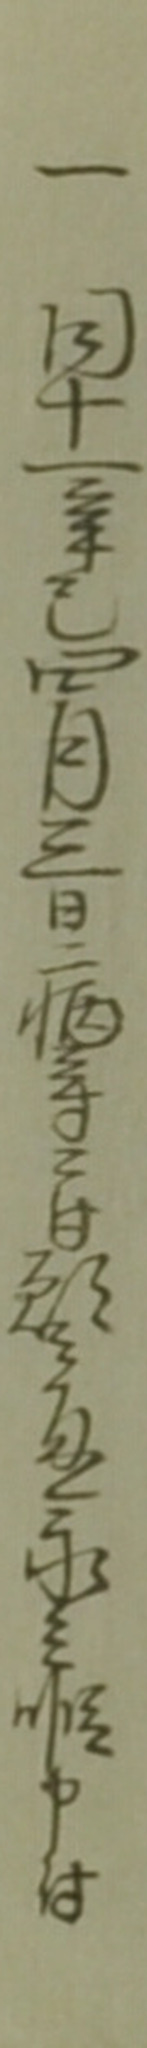一同十一辛巳四月三日病気ニ付願之通永之暇申付

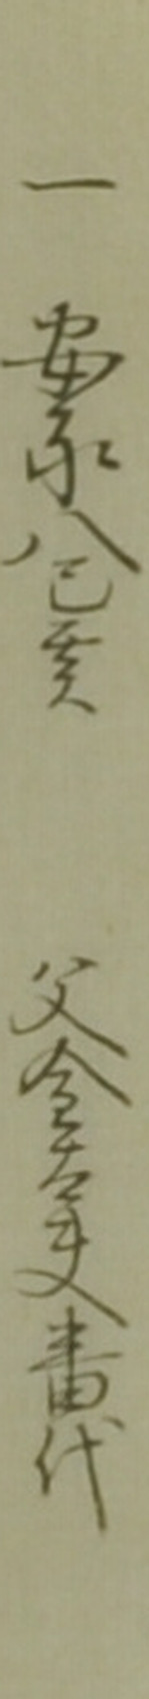一安永八己亥父金太夫番代
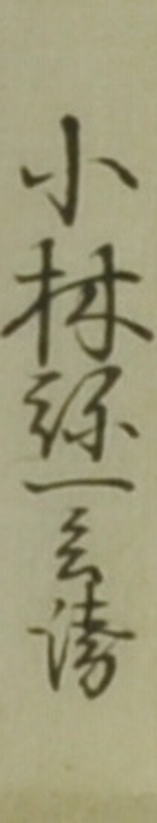小林弥一兵衛
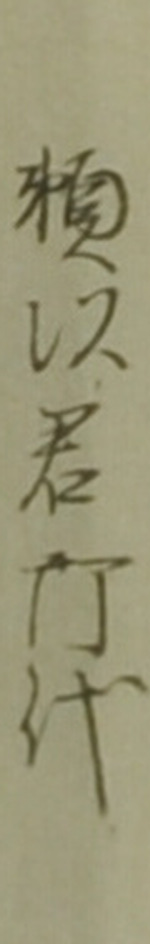頼以君御代
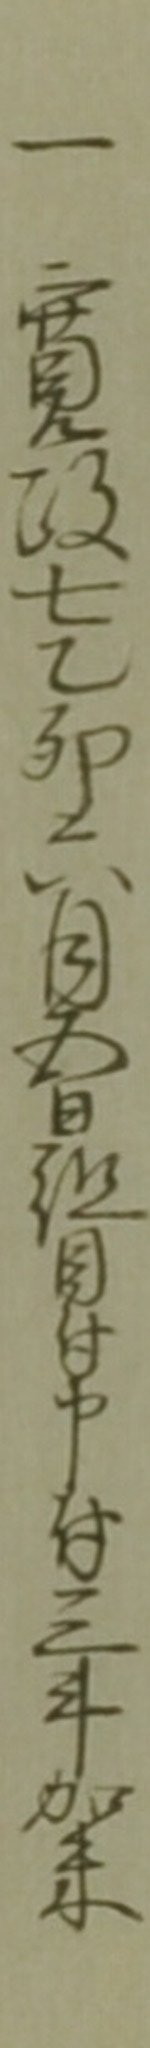一寛政七乙卯六月五日組目付申付三斗加米
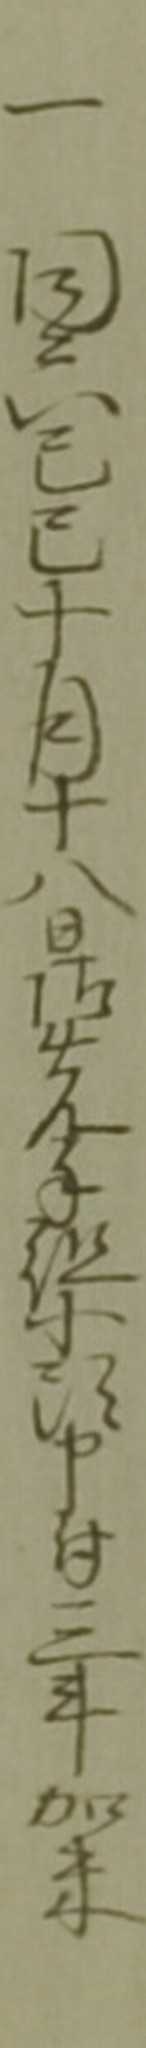一同六己巳十月十八日御先手組小頭申付三斗加米
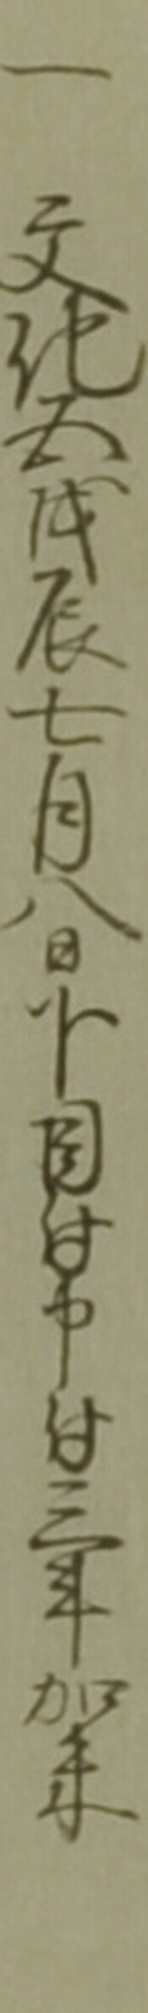一文化五戌辰七月八日下目付申付三斗加米
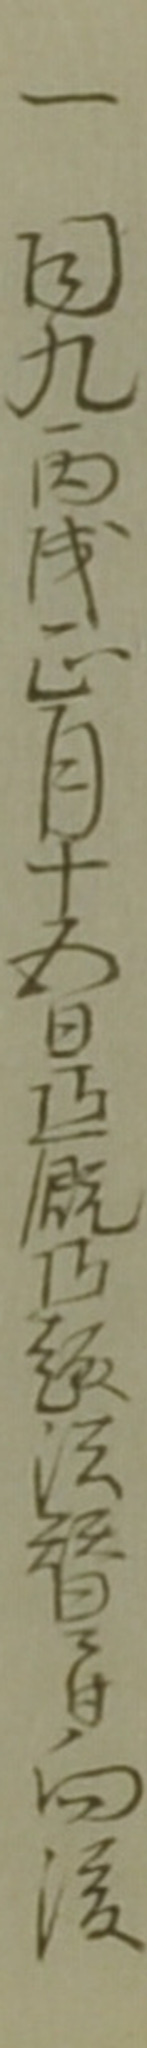一同九丙戌正月十五日御厩御趣法替ニ付向後
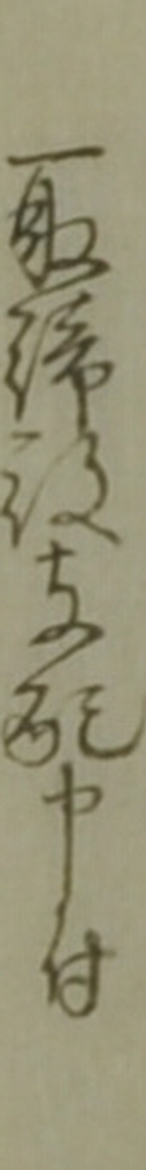取締役支配申不
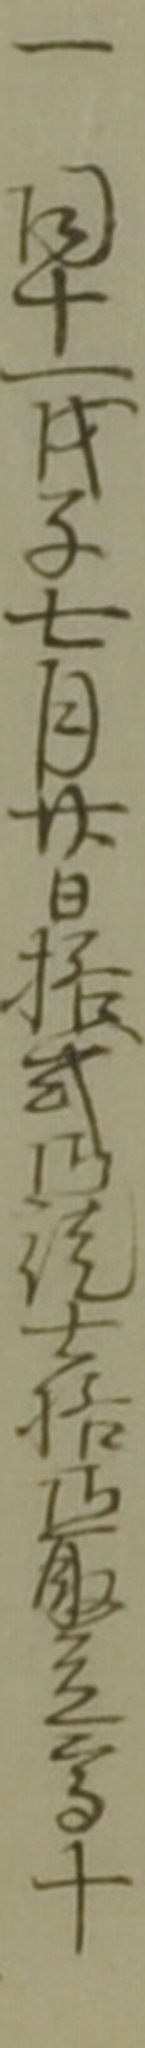一同十一戌子七月廿日格式御徒士格御取立高十
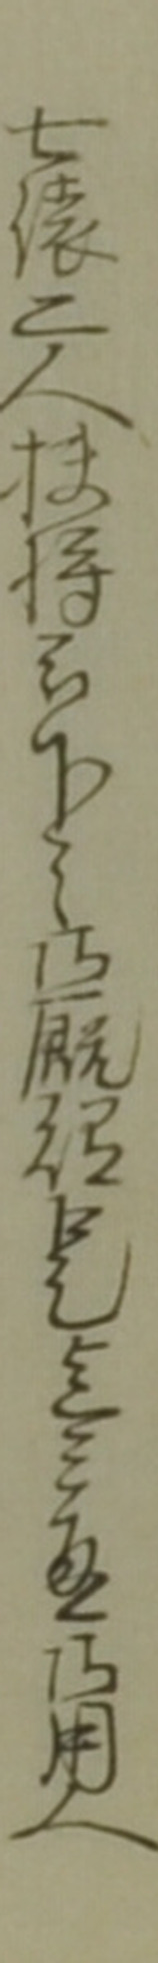七俵二人扶持被下之御厩賄是迄之通御用人
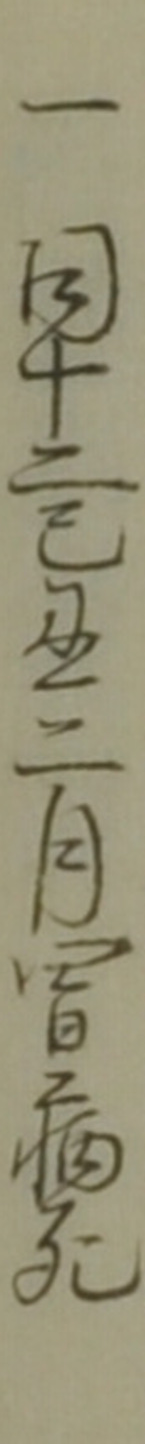一同十二己丑二月四日病死
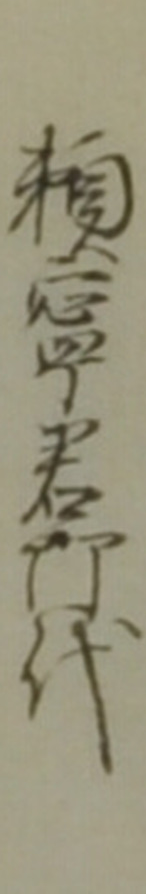頼寧君御代
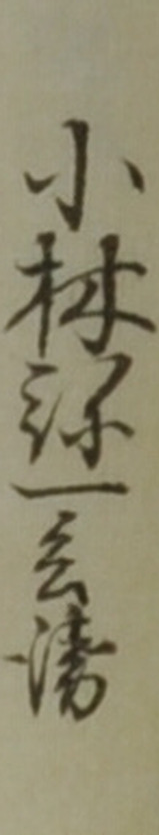小林弥一兵衛
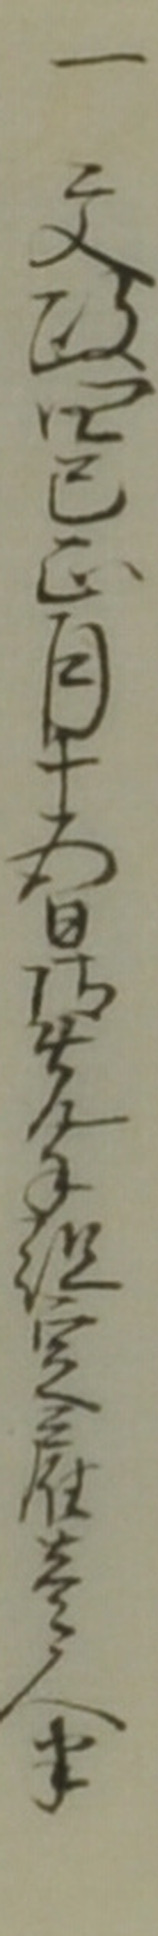一文政四巳正月十五日御先手組定雇壱人半
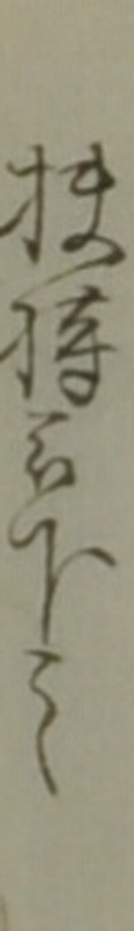扶持被下之
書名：無足諸士勤仕録（七）
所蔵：伊那市立高遠町図書館・合同会社AMANE
